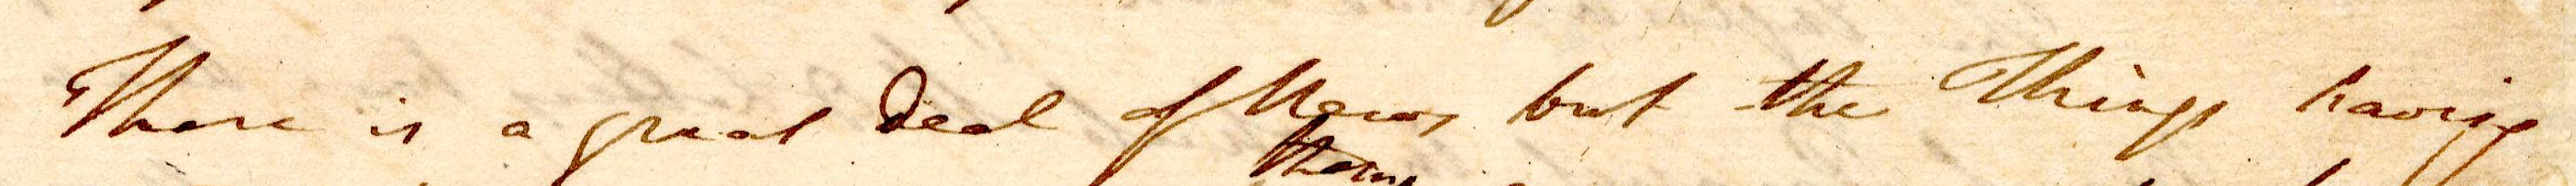There is a great deal of News but the Things having
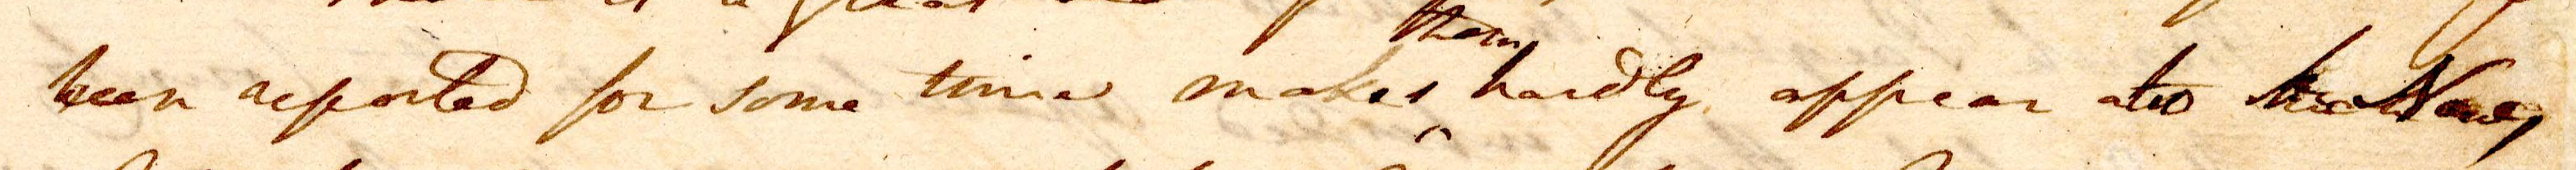been reported for some time makes ^ hardly appear to be New
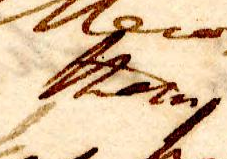those
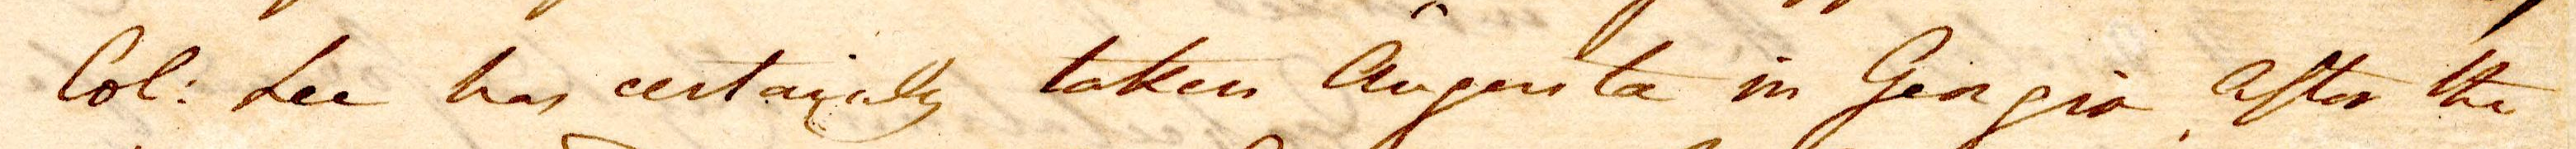Col. Lee has certainly taken Augusta in Georgia After the
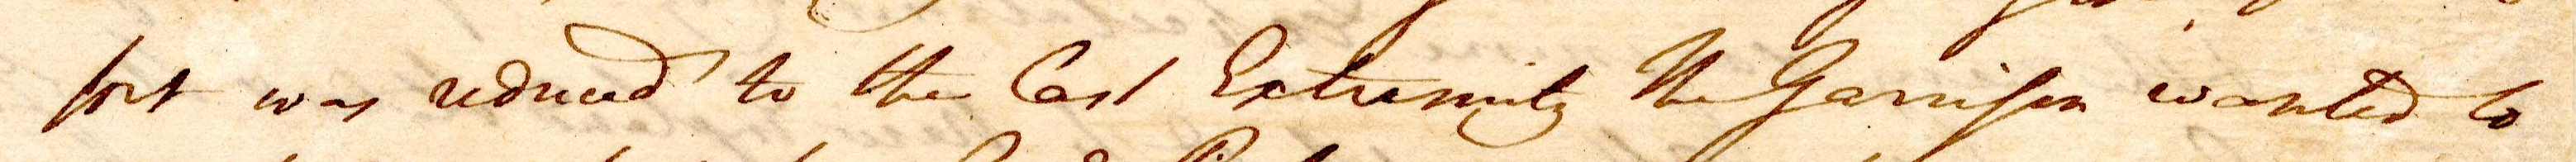fort was reduced to the last Extremity the Garrison wanted to
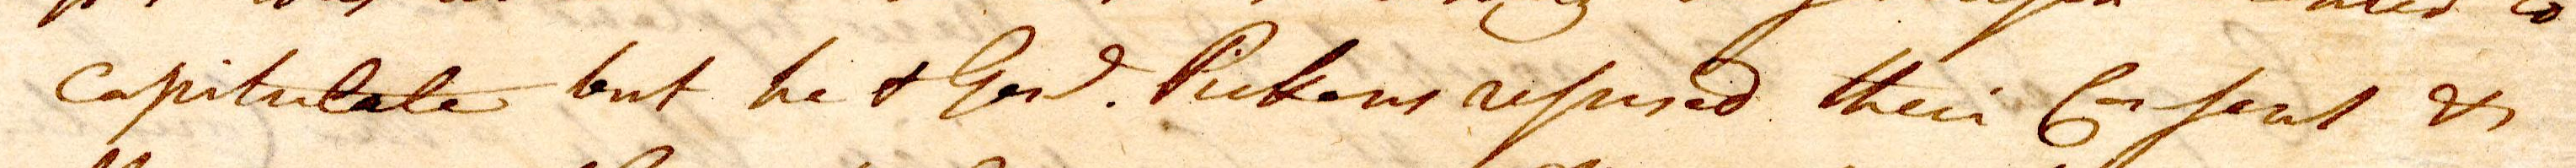capitulate but he & Gen^l. Pickens refused their defeat &
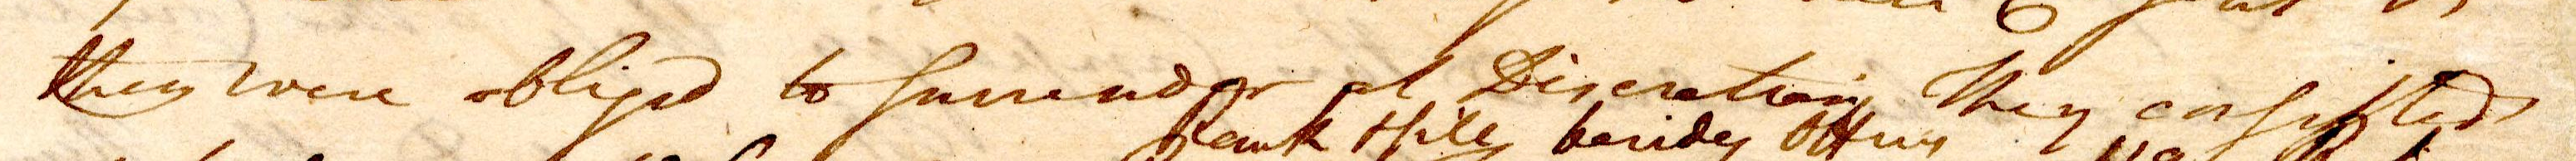they were obliged to surrender at Discretion, they consisted
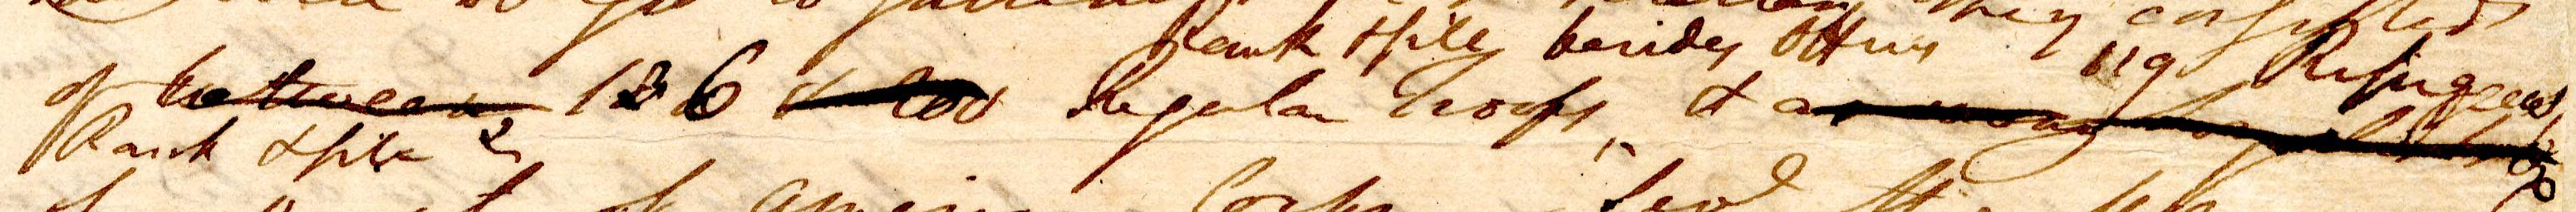of [between] 106 [& 200] Regular Troops ^ & [____________]
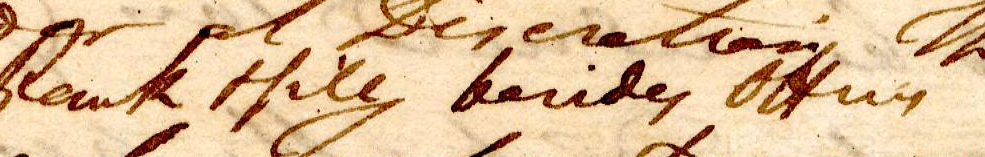Rank & file besides Officers
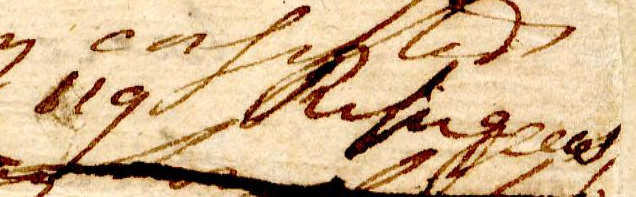119 Refugees
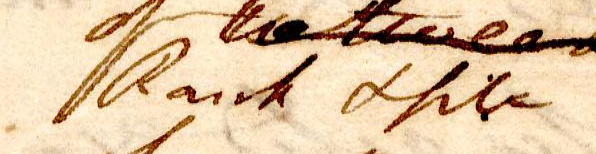Rank & file
